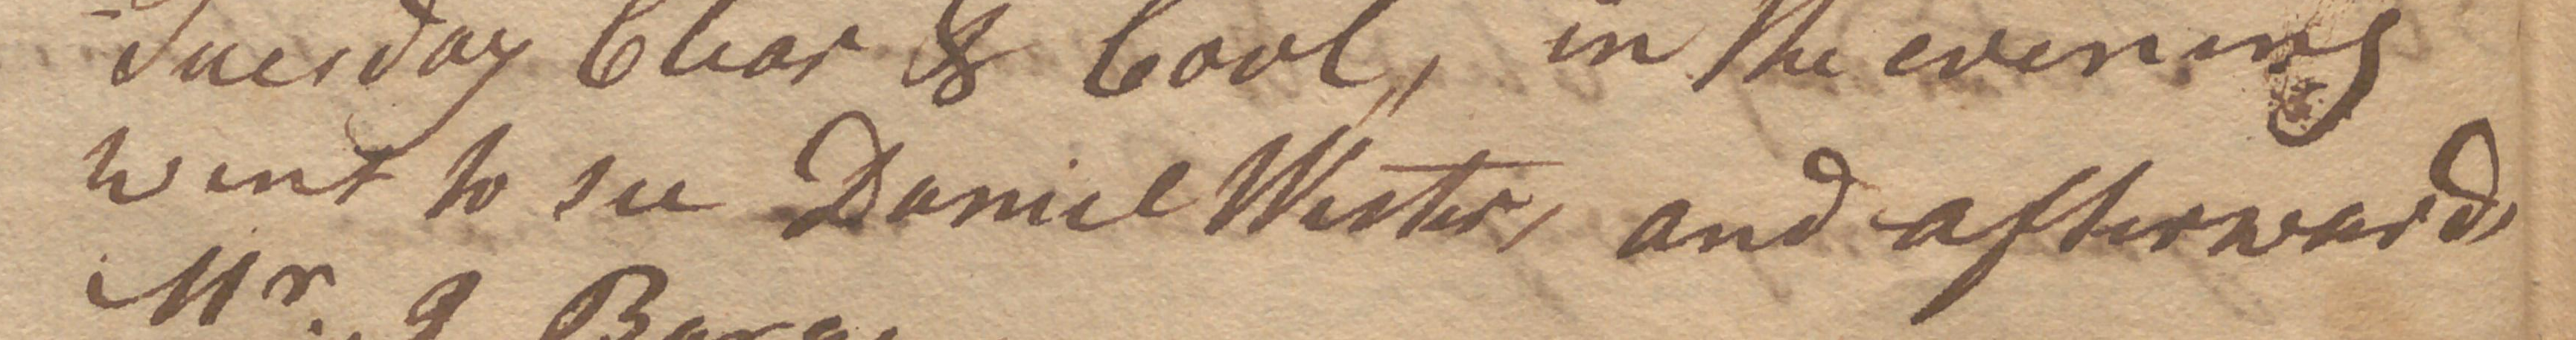went to see Daniel Wester and afterward
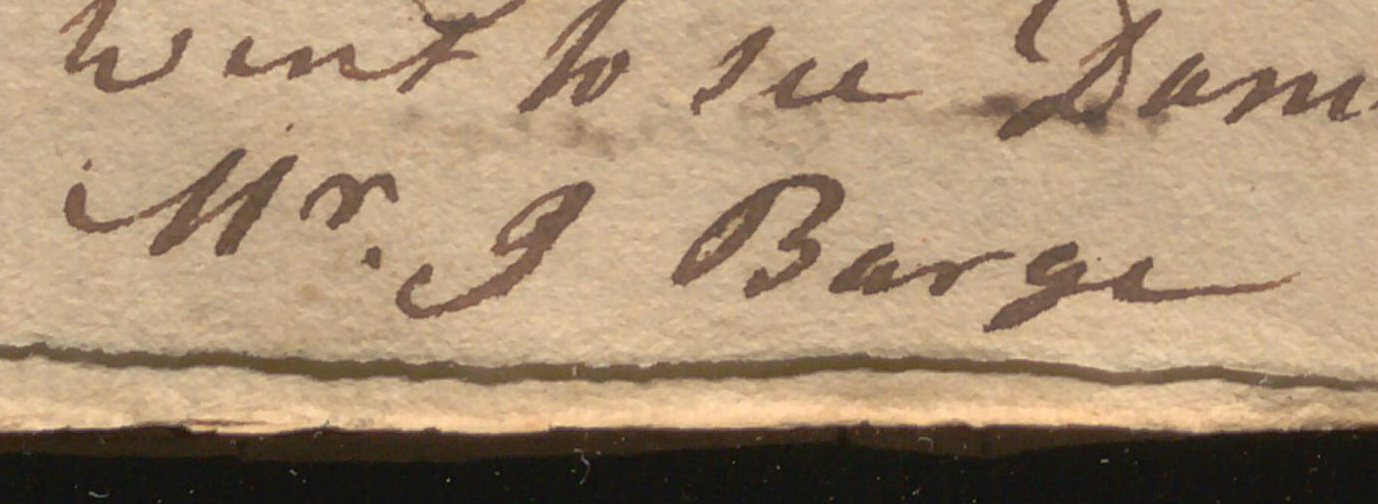M^r. J Barge
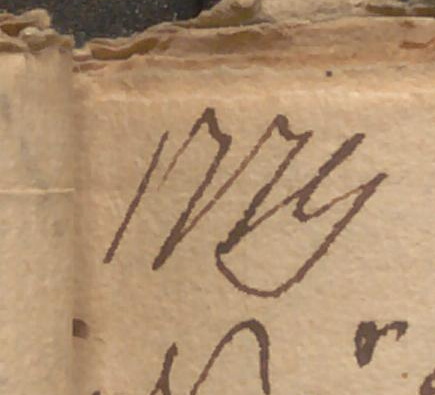1779
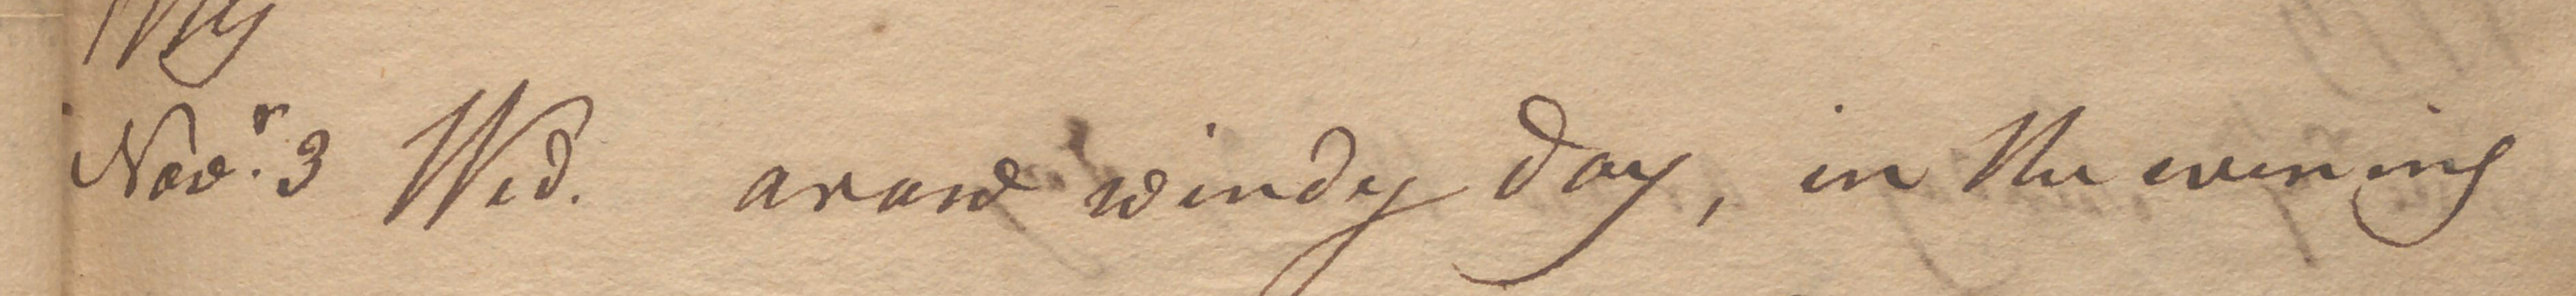Nov^r. 3 Wed. a raw windy day, in the evening
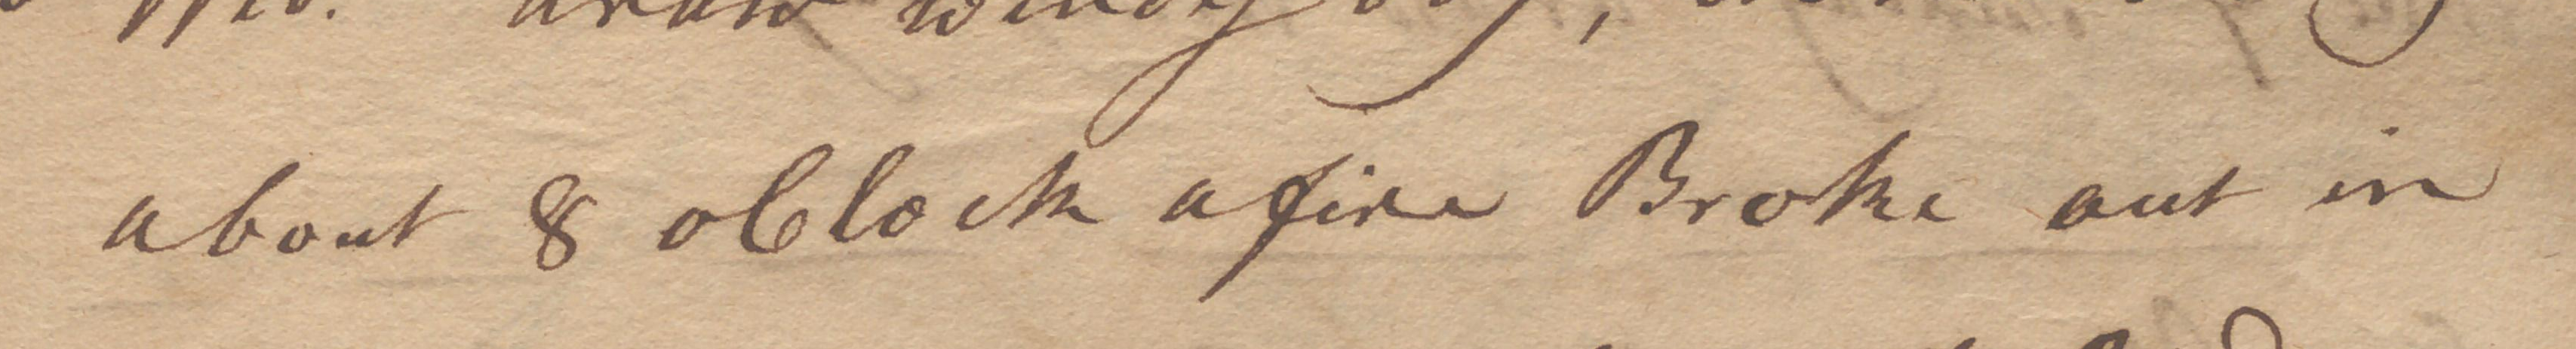about 8 oClock a fire Broke out in
